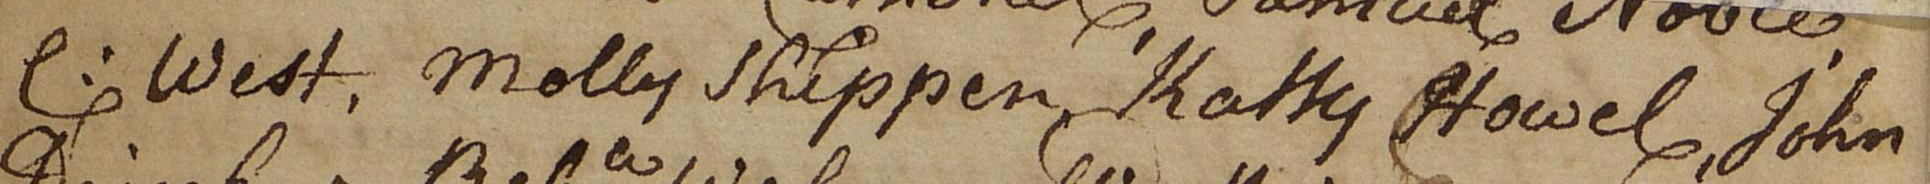C. West, Molly Shippen, Katty Howel, John
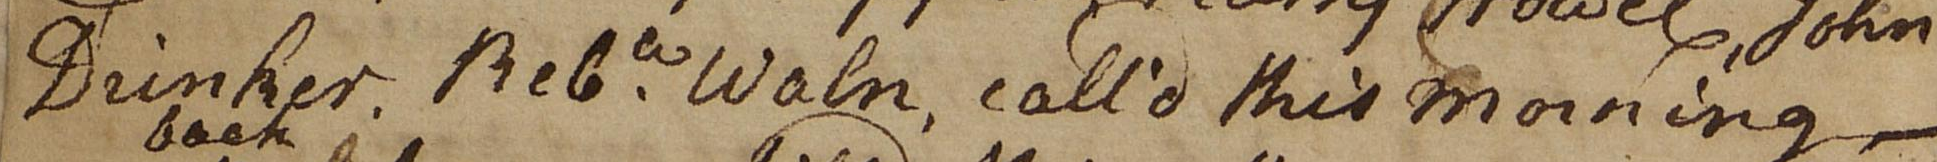Drinker, Reb^a. Waln, call'd this morning-
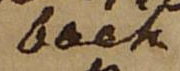back
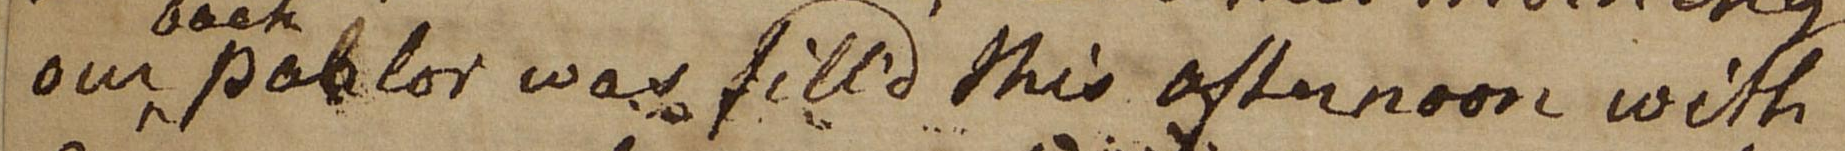our ^ parlor was fill'd this afternoon with
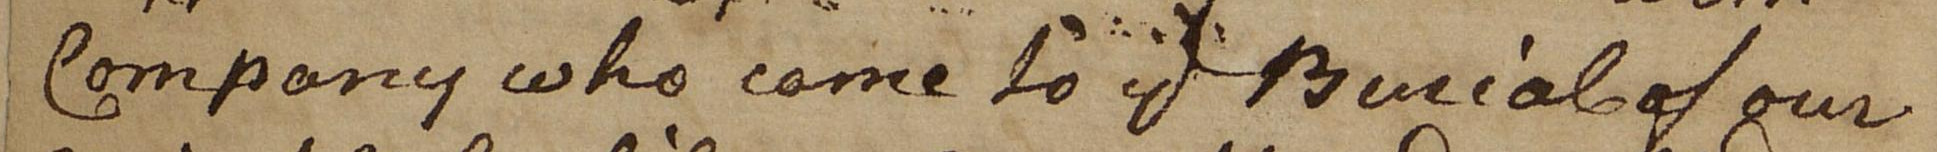Company who came to y^e Burial of our
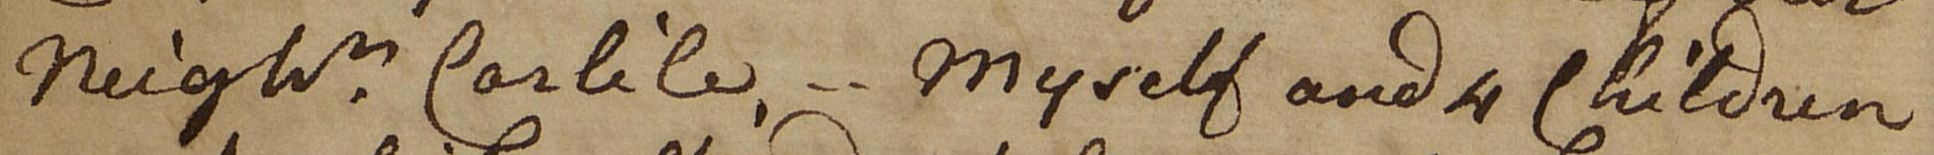Neigh^r. Carlile,-- Myself and 4 Children
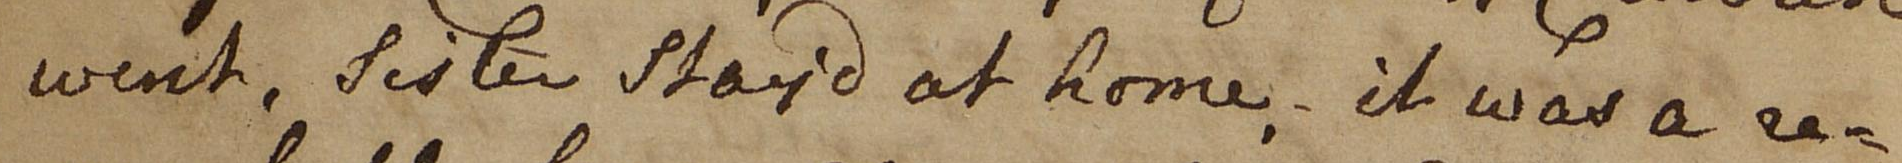went, sister stay'd at home,- it was a re-
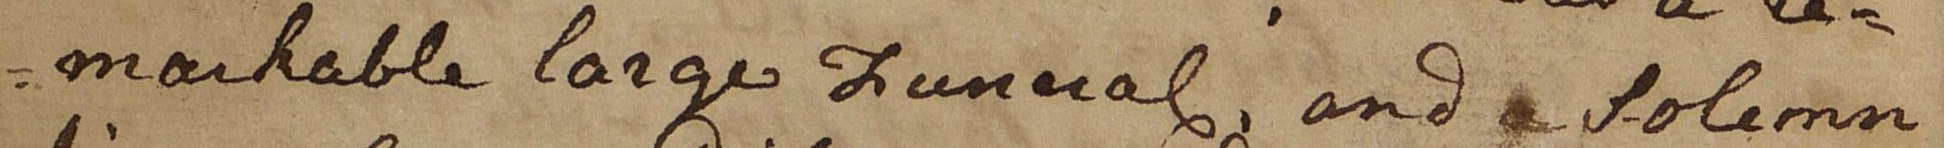-markable large Funeral, and a Solemn
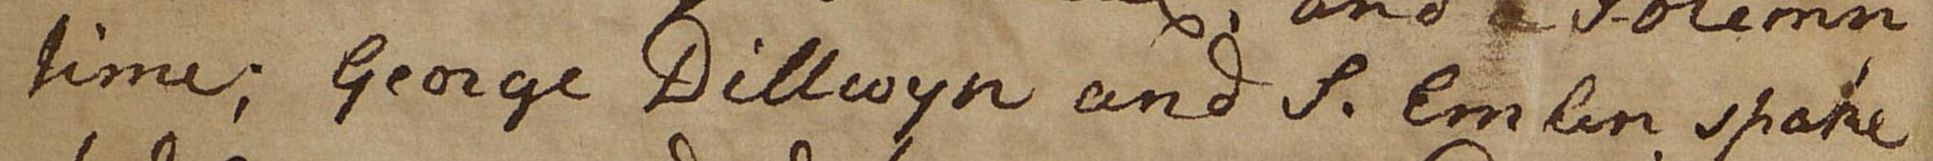time; George Dillwyn and S. Emlen spake
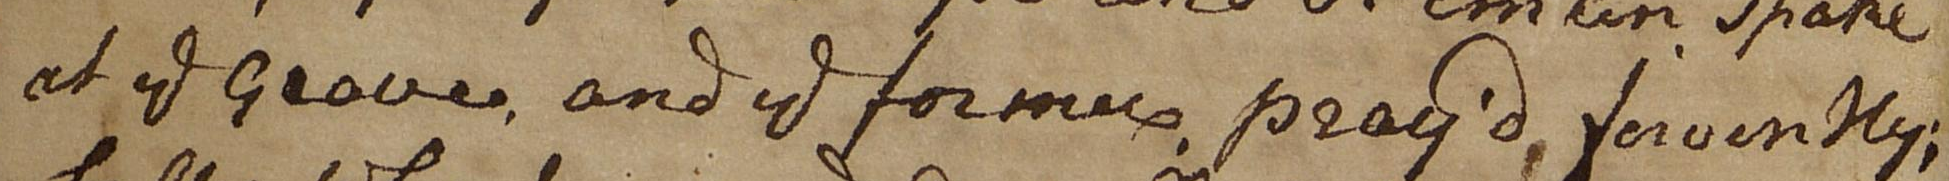at y^e Grave, and y^e former, pray'd fervently;
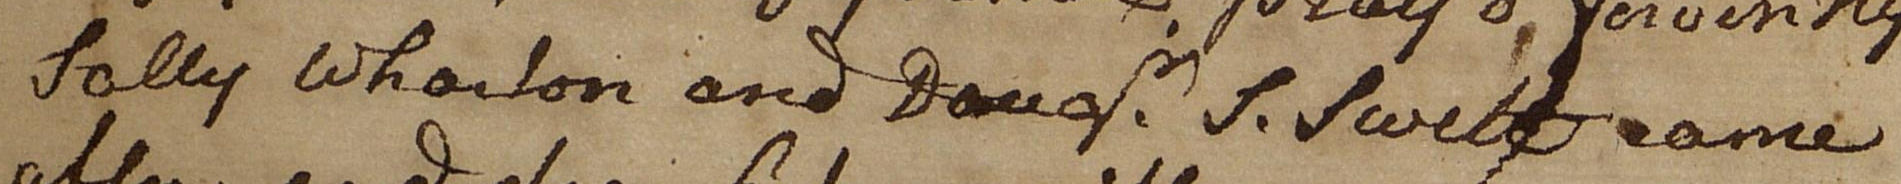Sally Wharton and Daug^r. S. Swett came
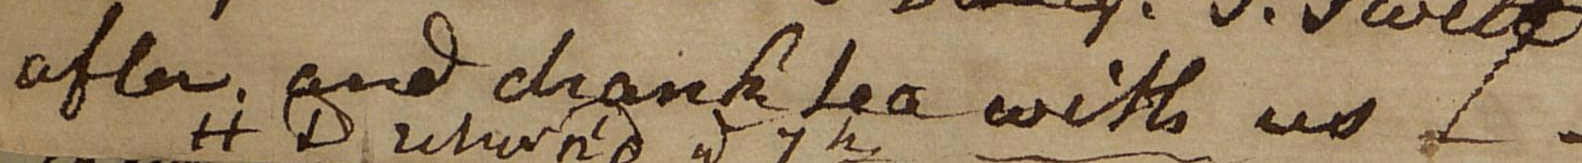after, and drank tea with us-
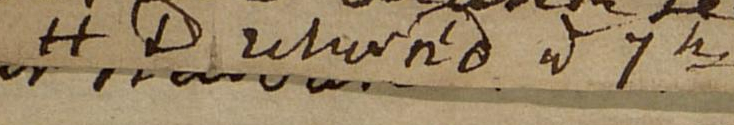HD return'd y^e 7^h
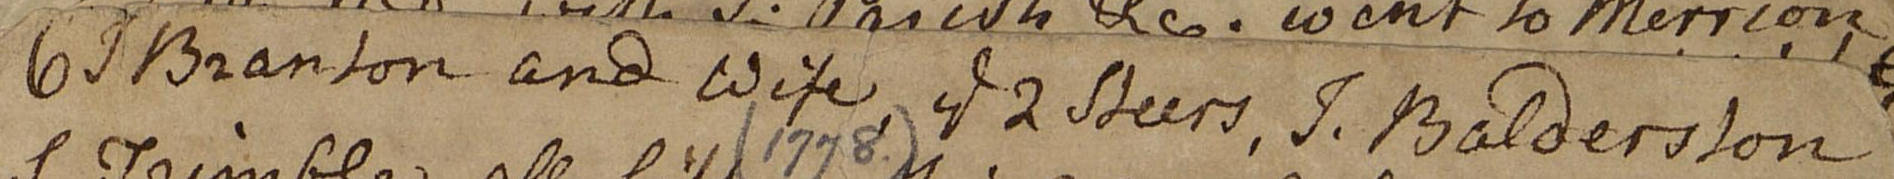6 I Branton and Wife y^e 2 Steers, I. Balderston
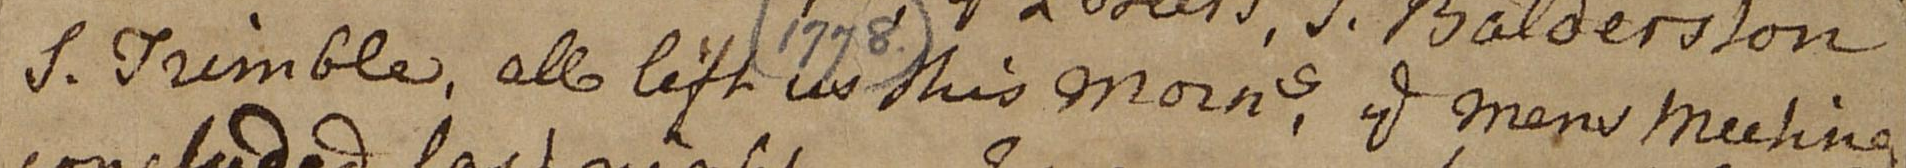S. Trimble, all left us this morn^g, y^e mens meeting
